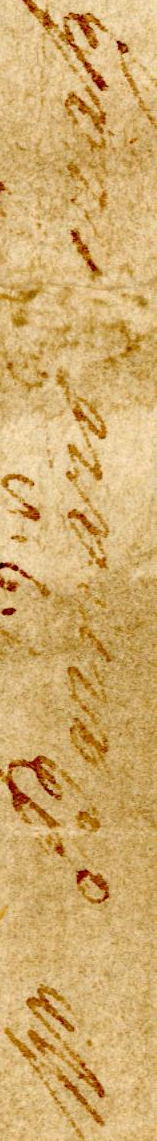M^r Barnard Gratz
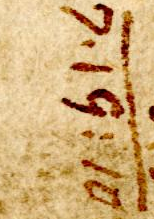7.19:10
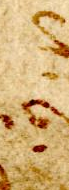6.
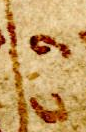6.3
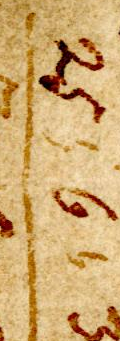25 6 3
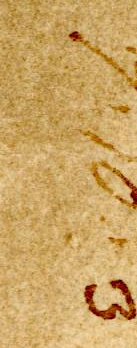7.10.3
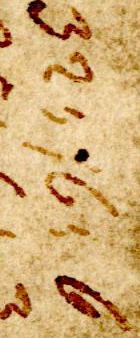32.6 6
